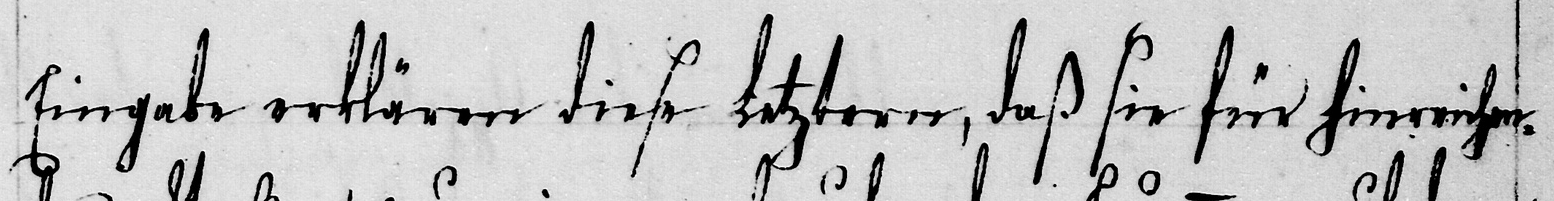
Eingabe erklären diese Letztern, daß sie für hinreich¬
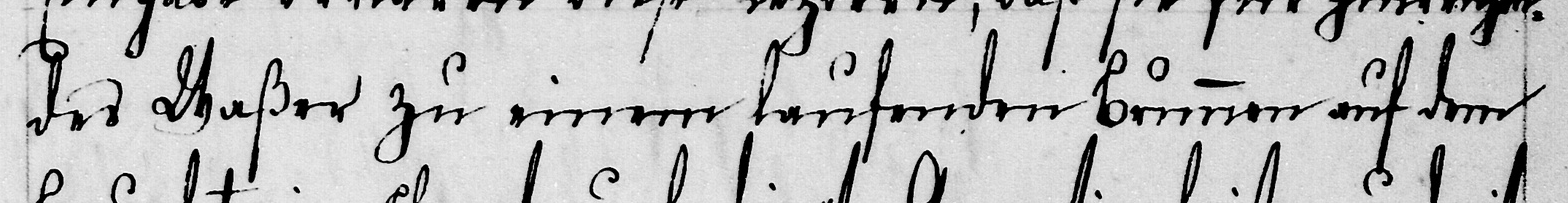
des Waßer zu einem laufenden Brunnen auf dem
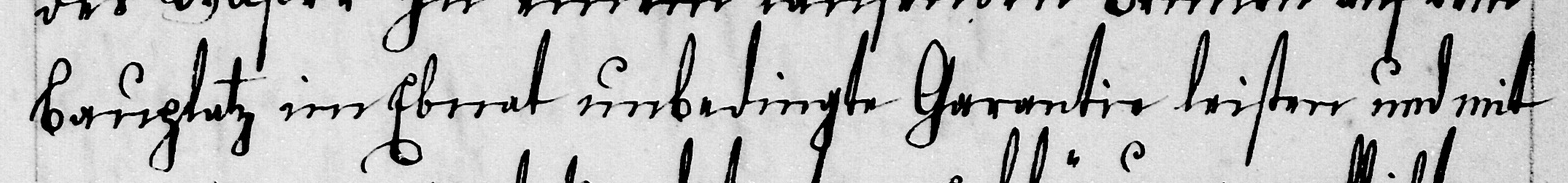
Bauplatz im Ebnat unbedingte Garantie leisten und mit
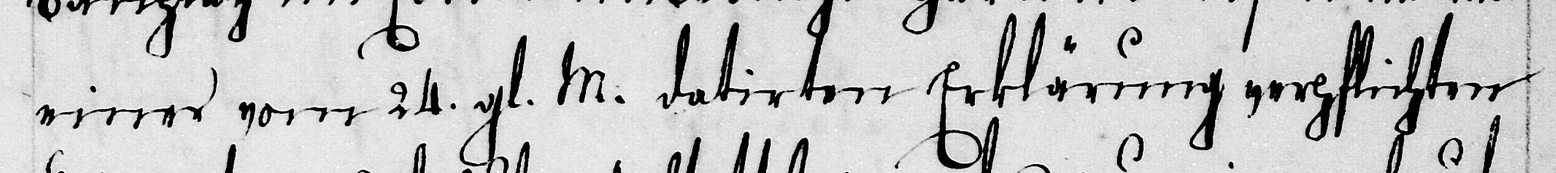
einer vom 24. gl. M. datirten Erklärung verpflichten
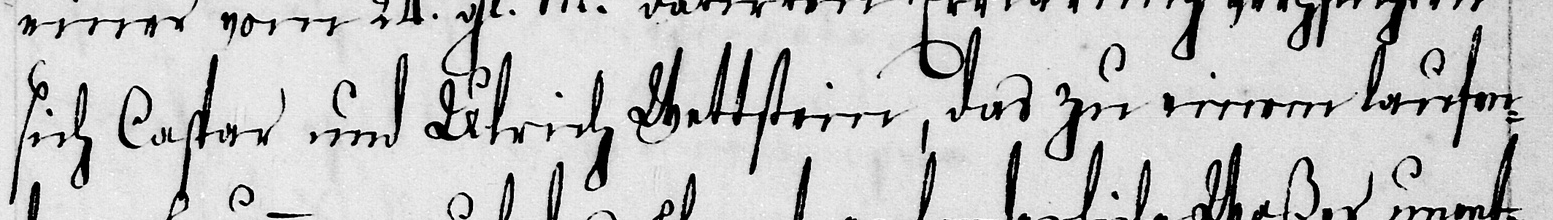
ich Caspar und Ulrich Wettstein, das zu einem laufen¬
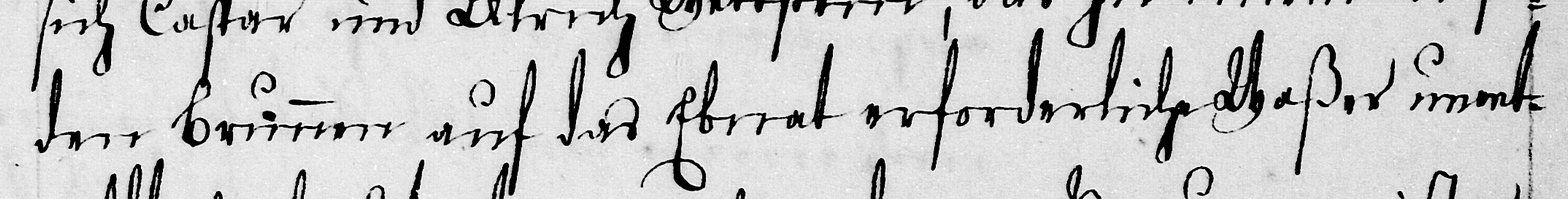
den Brunnen auf das Ebnat erforderliche Waßer unent¬
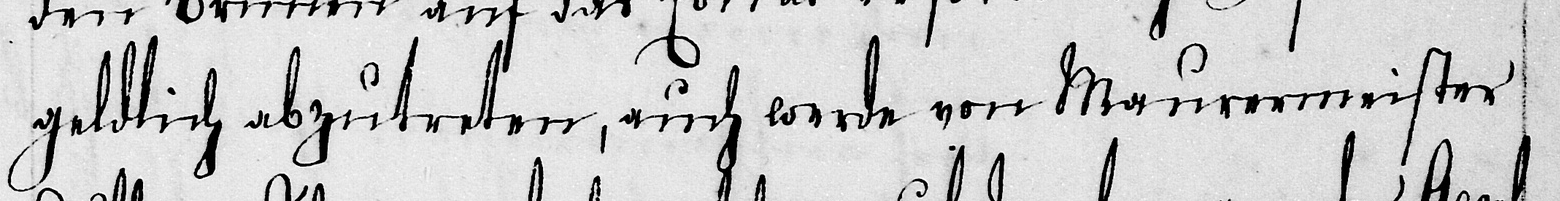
geldlich abzutreten, auch werde von Maurermeister
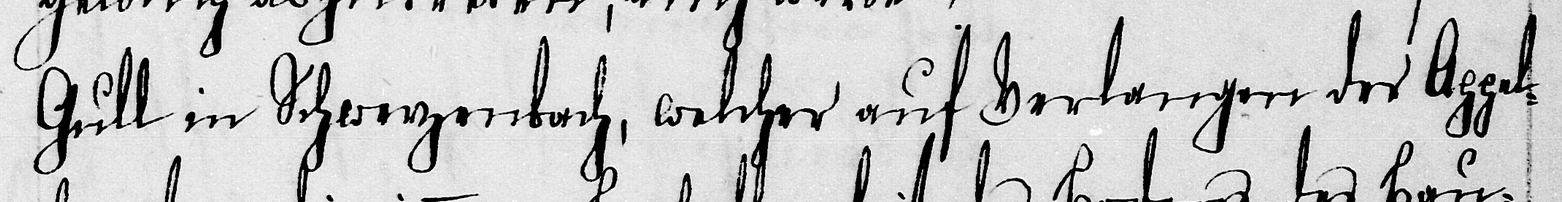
Gull in Schwerzenbach, welcher auf Verlangen der Appel¬
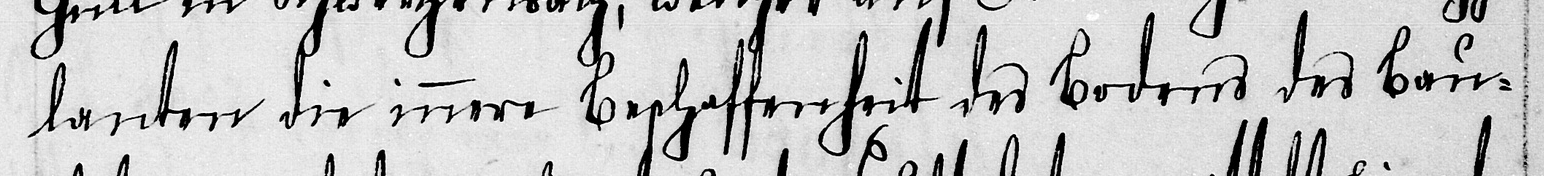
lanten die innere Beschaffenheit des Bodens des Bau¬
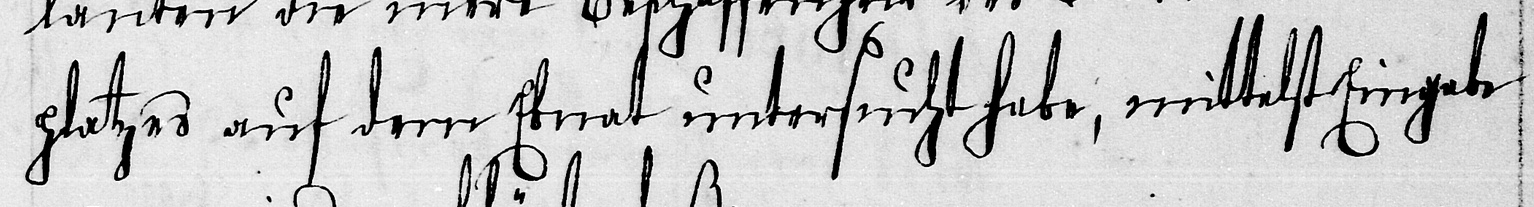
platzes auf dem Ebnat untersucht habe, mittelst Eingabe
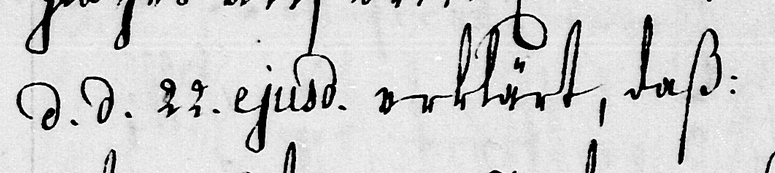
d. d. 22. ejusd. erklärt, daß:
